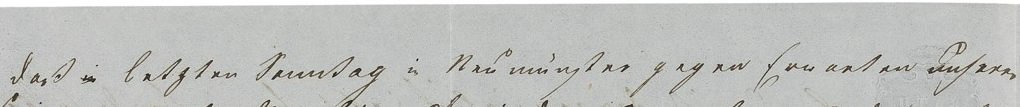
daß inletzten Sonntag in Neumünster gegen Erwarten unserer
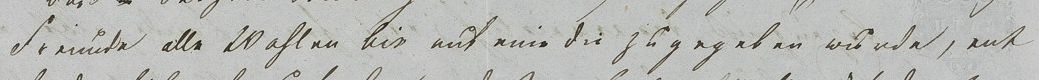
Freunde alle Wahlen bis auf eine die zugegeben wurde, ent-
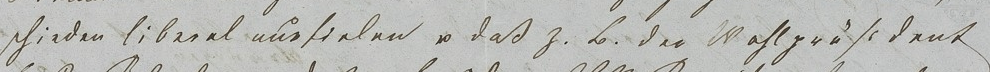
schieden liberal ausfielen & daß z. B. der Wahlpräsident
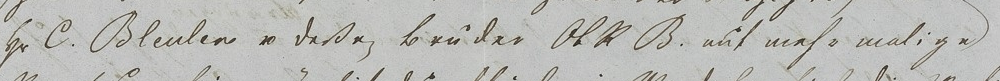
Hr C. Bleuler & deßen Bruder ObR B. auf mehrmalige
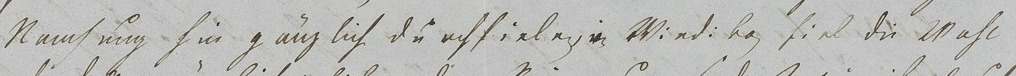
Namsung hin gänzlich durchfielen, in Wiedikon fiel die Wahl
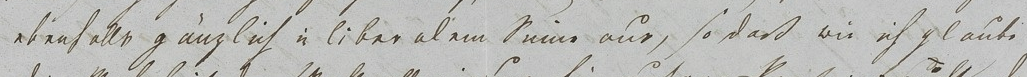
ebenfalls gänzlich in liberalem Sinne aus, so daß wie ich glaube
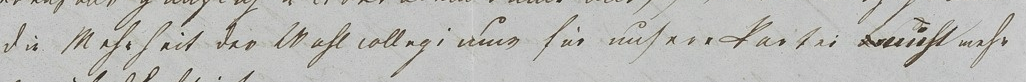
die Mehrheit des Wahlcollegiums für unsere Partei ... nicht mehr
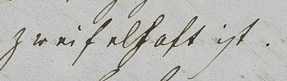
zweifelhaft ist.
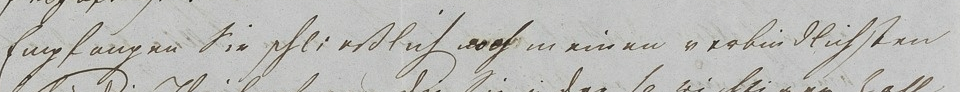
Empfangen Sie schließlich noch meinen verbindlichsten
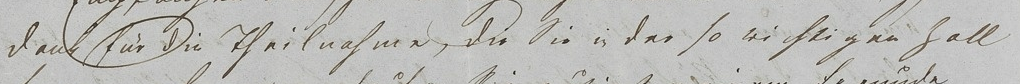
Dank für die Theilnahme, die Sie in der so wichtigen Zoll-
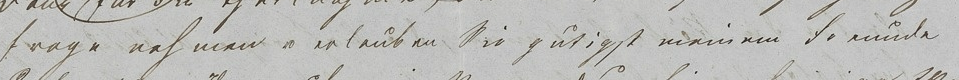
frage nahmen & erlauben Sie gütigst meinem Freunde
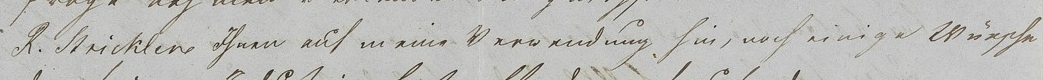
R. Strickler Ihnen auf meine Verwendung hin, noch einige Wünsche
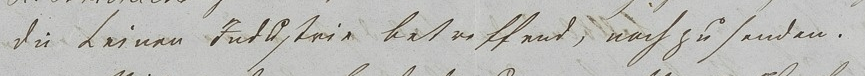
die Leinen Industrie betreffend, nachzusenden.
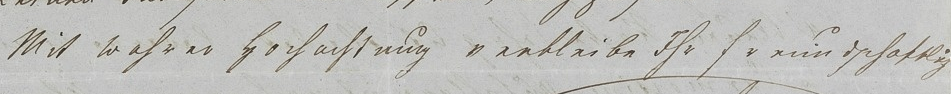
Mit wahrer Hochachtung verbleibe Ihr freundschaftlich
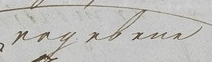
ergebene
